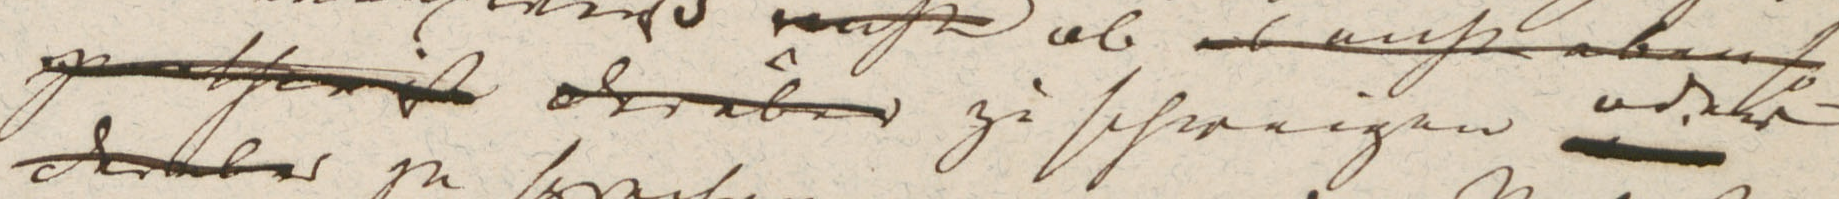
gerathen ist darüber zu schweigen wie oder
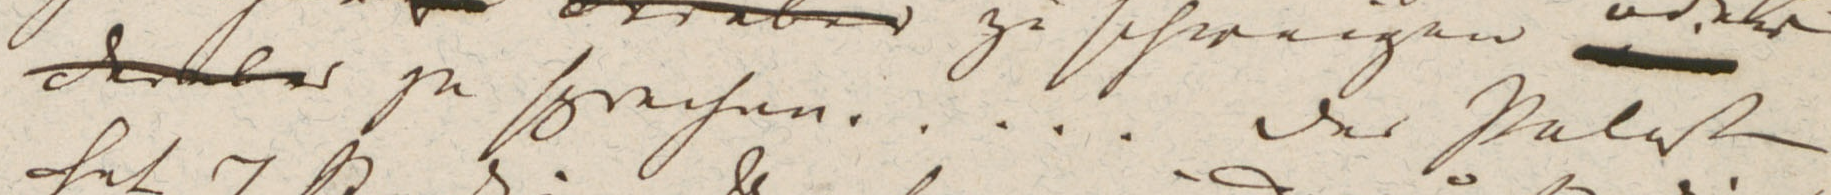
daruber zu sprechen..... Der Palast
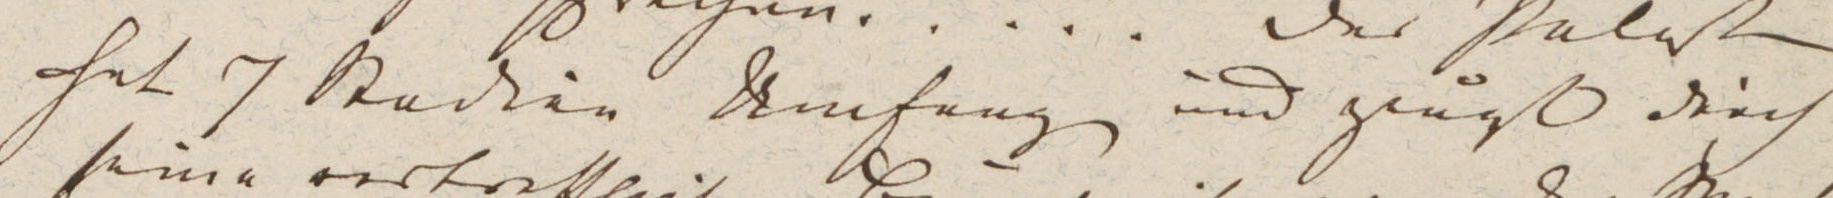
"hat 7 Stadien Umfang und zeugt durch
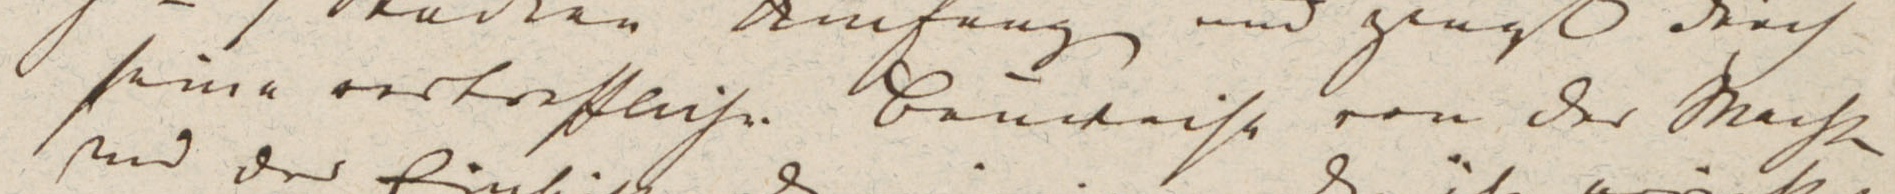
"seine vortreffliche Bauweise von der Macht
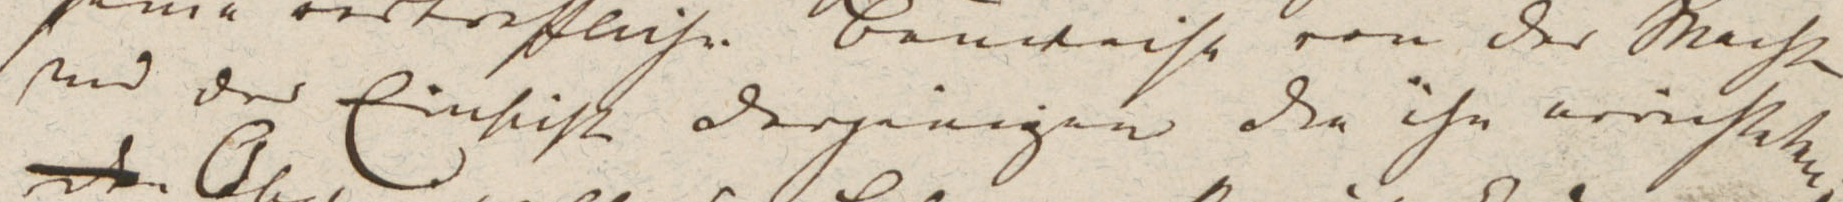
und der Einsicht derjenigen die ihn errichteten;
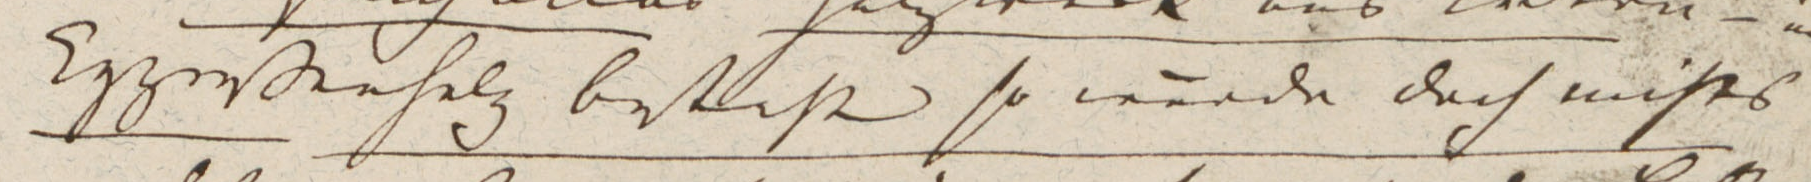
"Cypressenholz besteht so wurde doch nichts
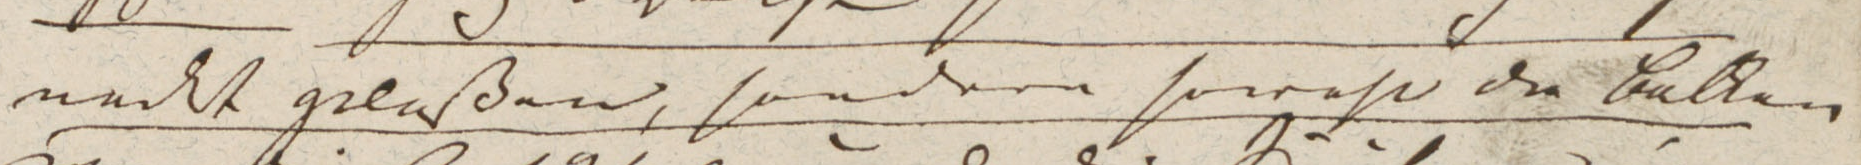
nackt gelassen, sondern sowohl die Balken
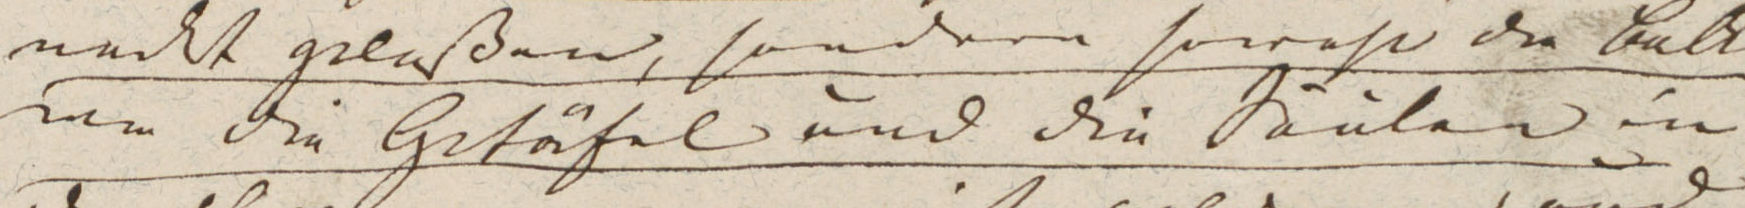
"wie die Getäfel und die Säulen in
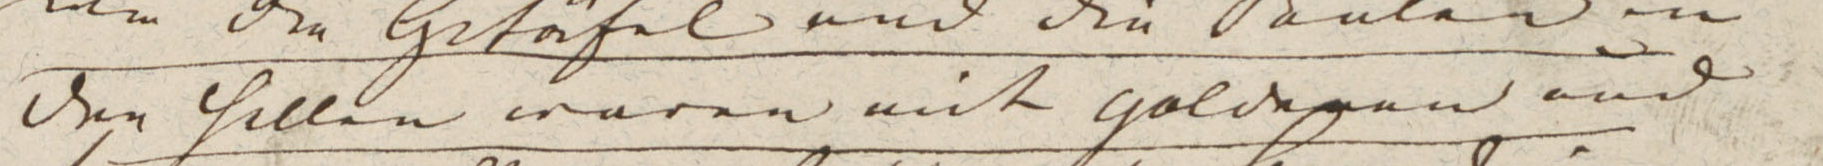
"den Hallen waren mit goldenen und
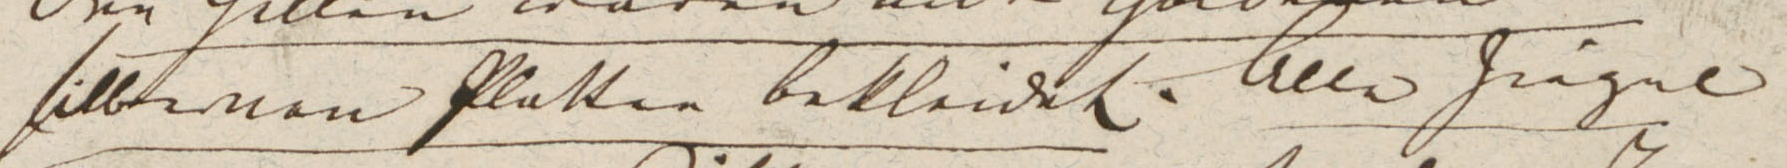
silbernen Platten bekleidet. Alle Ziegel
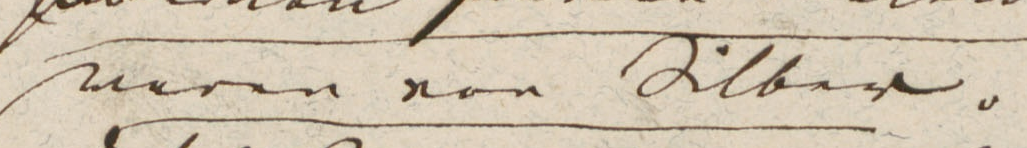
"waren von Silber.
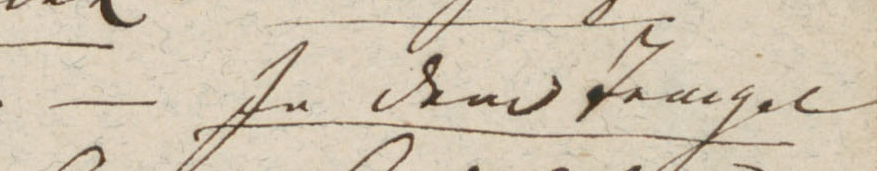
– In dem Tempel
